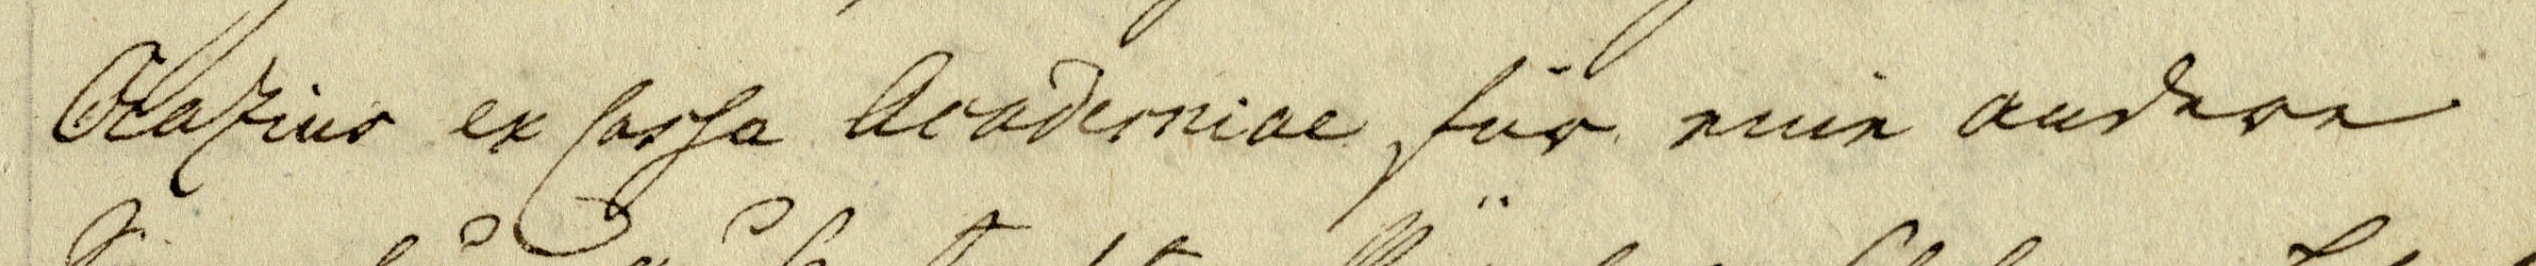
Crazius ex Cassa Academiae für eine andere
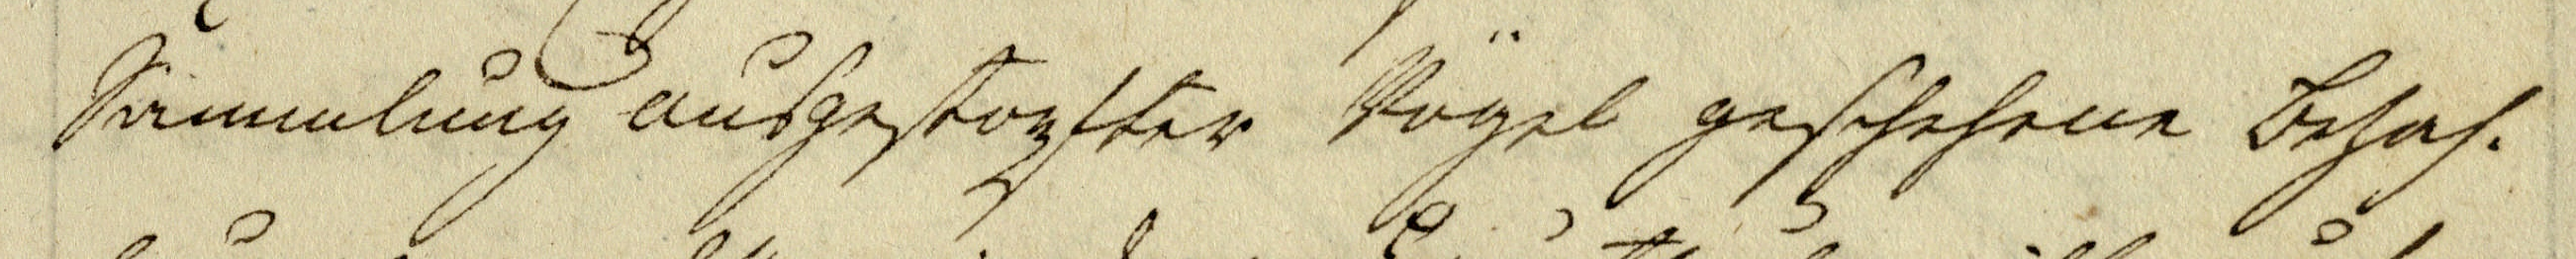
Sammlung ausgestopfter Vogel geschehene Bezah¬
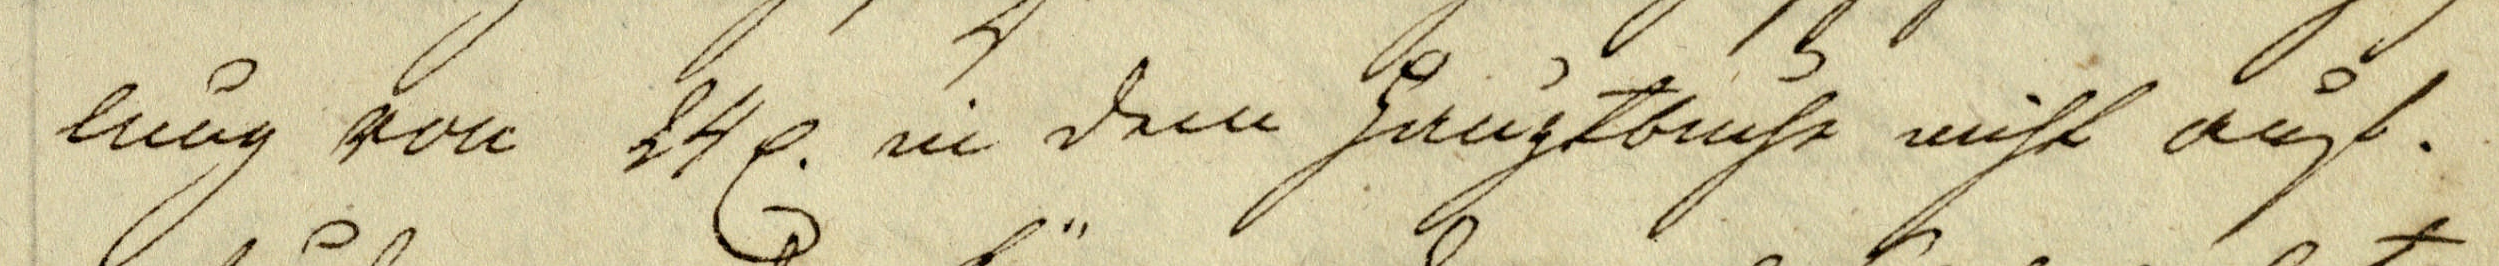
lung von 24 l. in dem Hauptbuche nicht auf¬
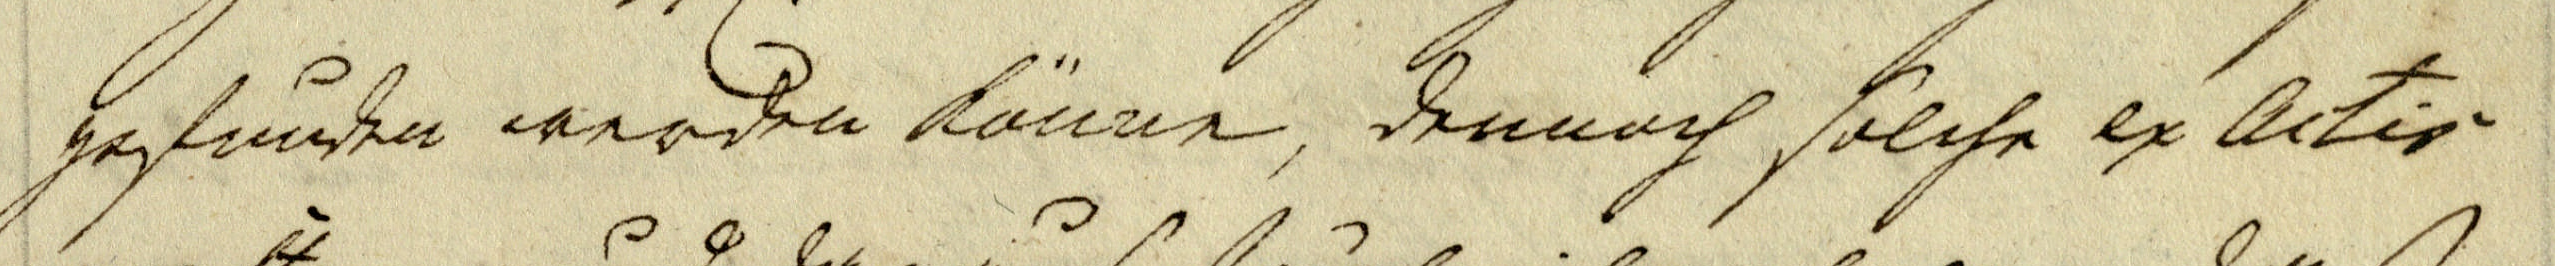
gefunden werden könne, dennoch solche ex Actis
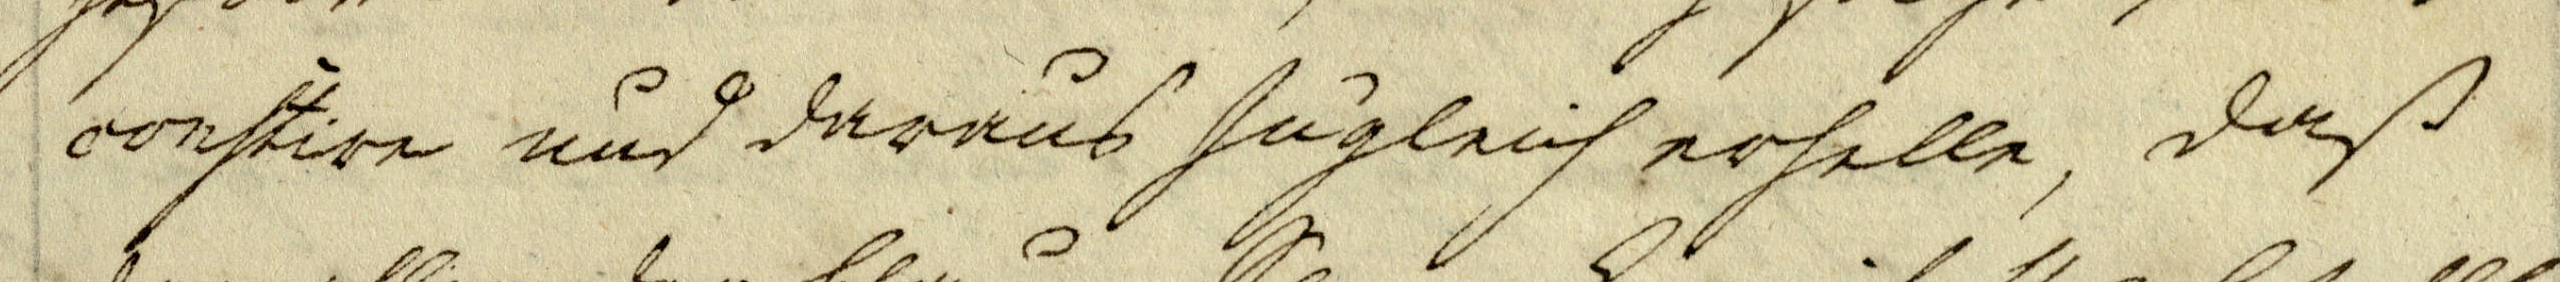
constire und daraus zugleich erhelle, daß
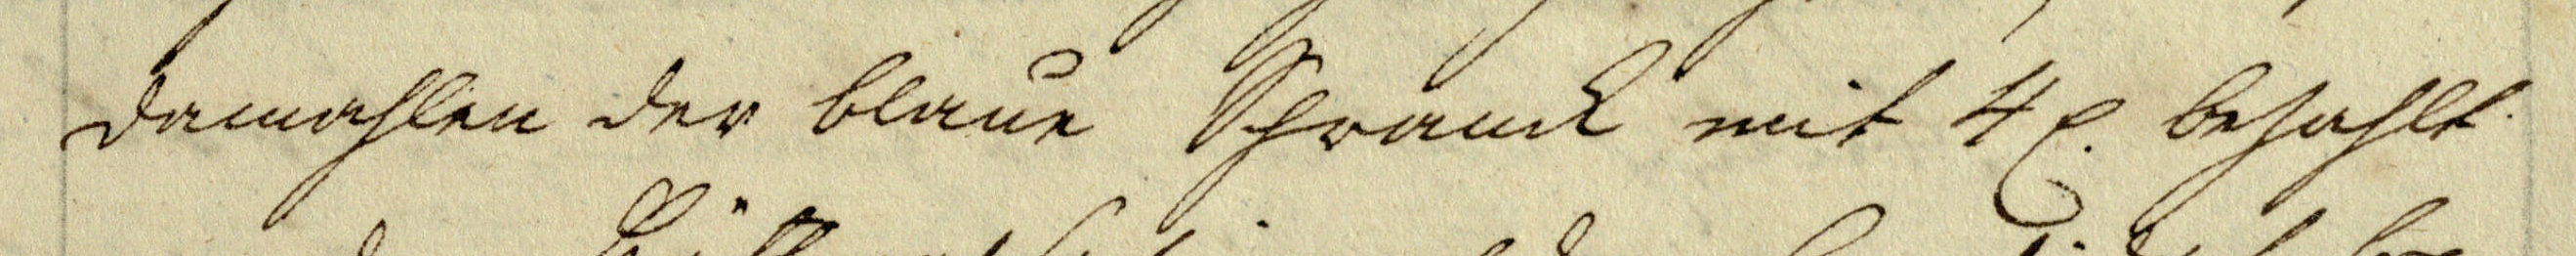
damahlen der blaue Schranck mit 4 l. bezahlt
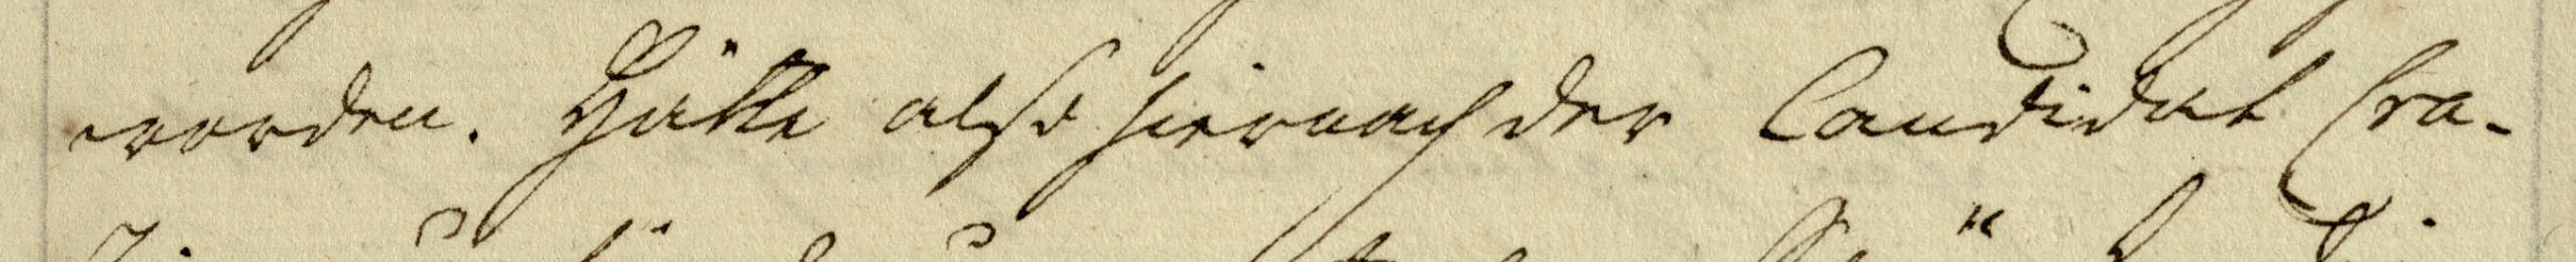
worden. Hätte also hiernach der Candidat Cra¬
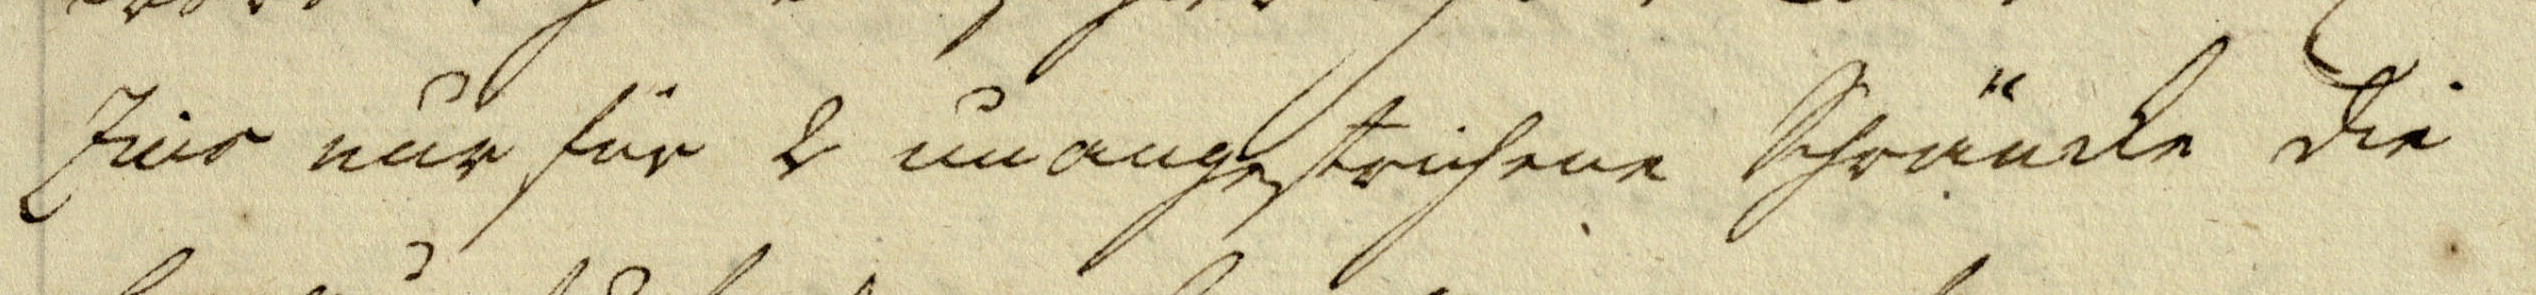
zius nur für 2 unangestrichene Schräncke die
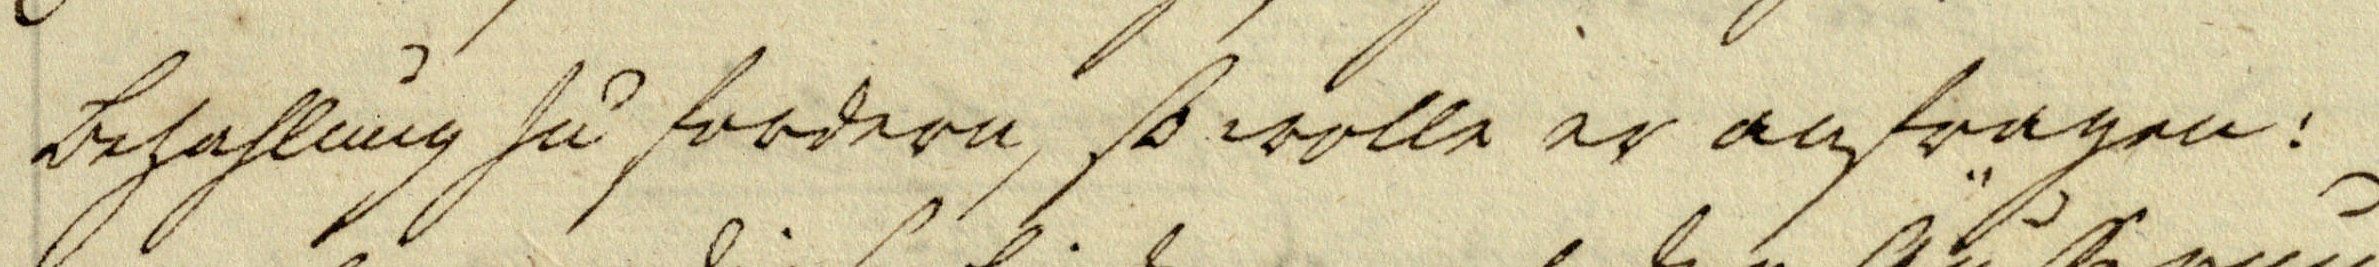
Bezahlung zu fordern, so wolle er anfragen:
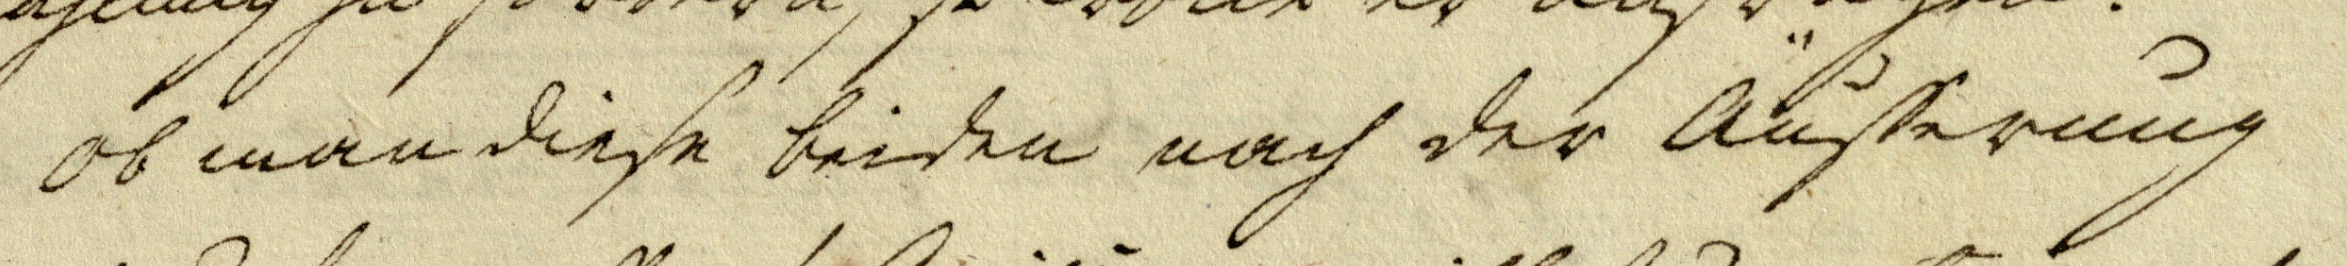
ob man diese beiden nach der Äusserung
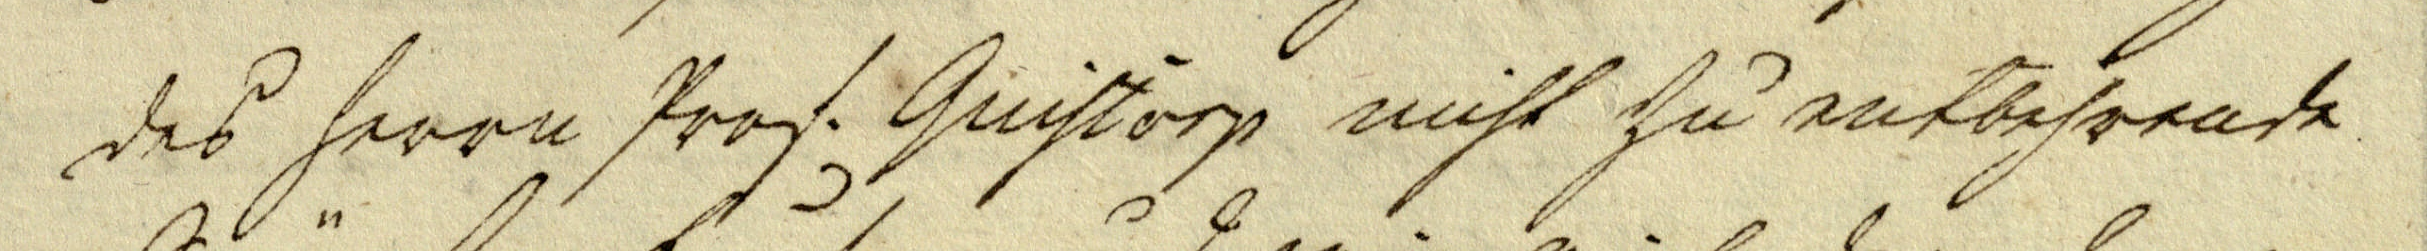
des Herrn Prof. Quistorp nicht zu entbehrende
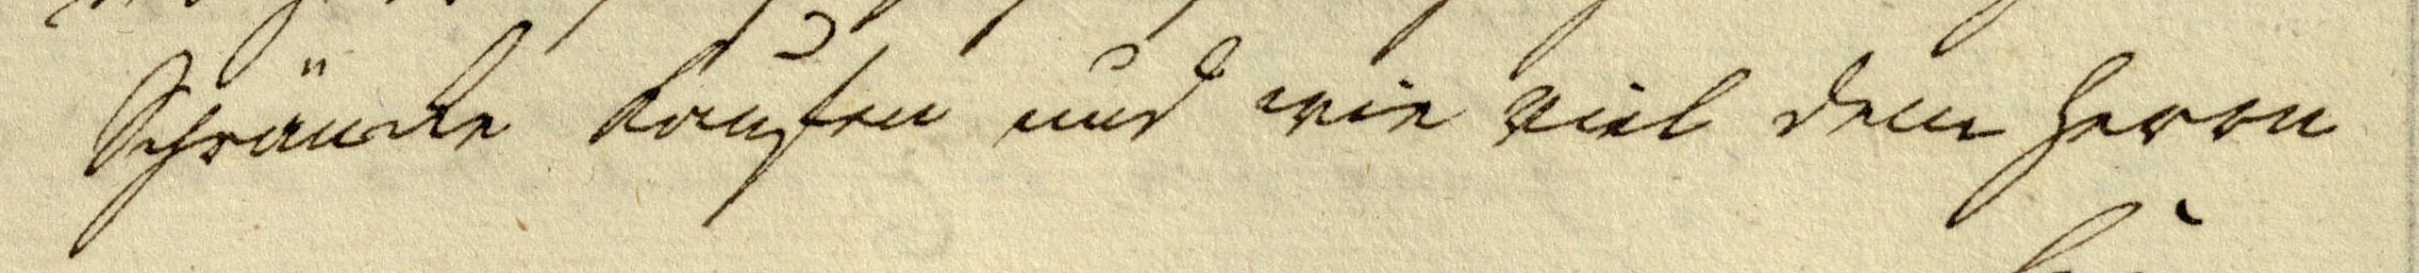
Schräncke kaufen und wie viel dem Herrn
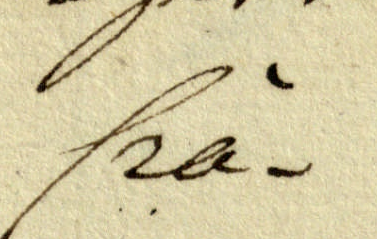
Cra¬
